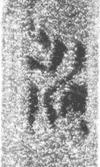○（篦）
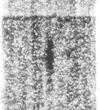又（有）
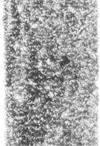紫
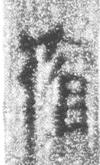○（錦）
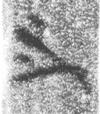之
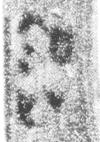○（篦）
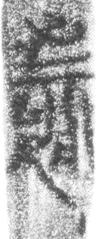襄（囊）
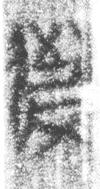○（縉）
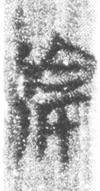綿（縵）
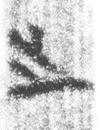之
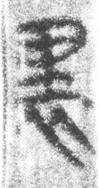裏
